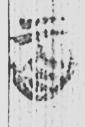百
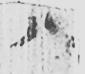八
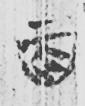百
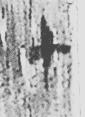七
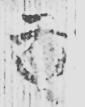百
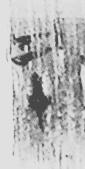{二十}
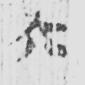六
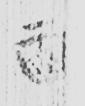百
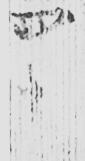{四十}
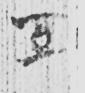五
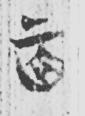百
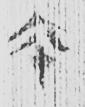{六十}
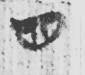四
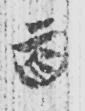百
